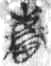○（巂）
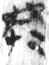十四
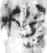檐（擔）
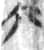六
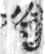檐（擔）
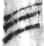三
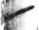一
